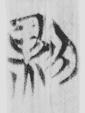則
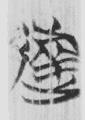{辶止㚔}
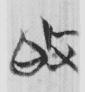敀
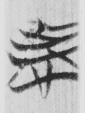者
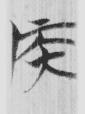侯
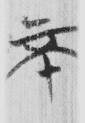不
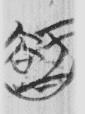智
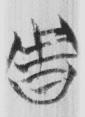周
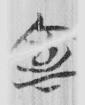室
